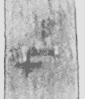七十
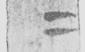二
